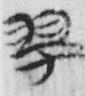○（羽）
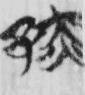郯
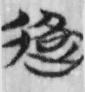○（路）
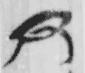尹
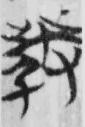發
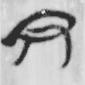尹
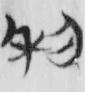利（利）
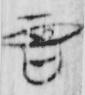言
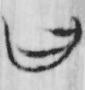曰
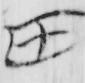甲
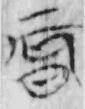晨
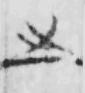之
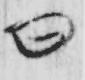日
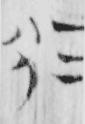小人
